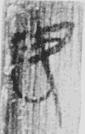母
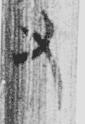又（有）
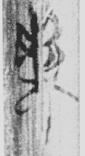柔
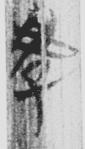○（教）
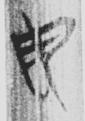母
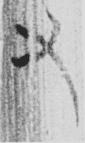又（有）
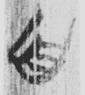首
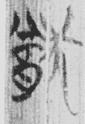猶
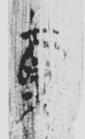植
